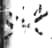未
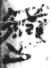○（復）
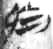於
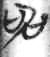申
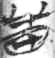○（怨）
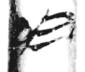於
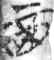梄（酉）
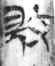○（媚）
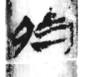於
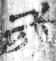戌
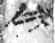凡
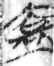盍（蓋）
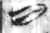日
